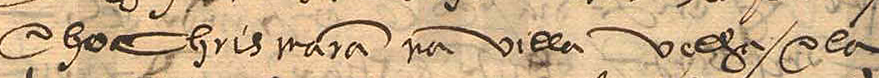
e ho Chrismarā na villa velha / e la
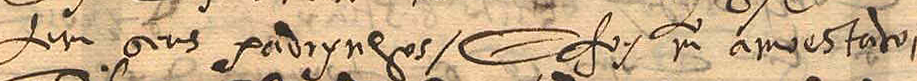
tem seus padrynhos / E foy mto amoestado,
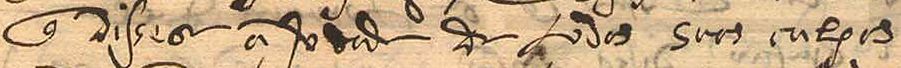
q̄ dissese a ꝟdade de todas suas culpas
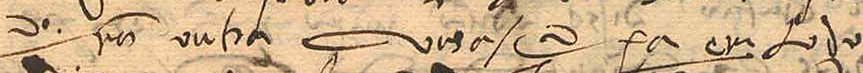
e nā outra cousa / e ꝑa em todo
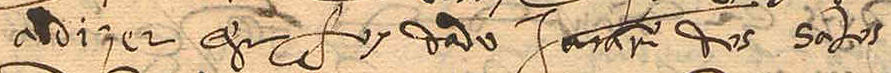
a dizer lhe foy dado Juramto dos sātos
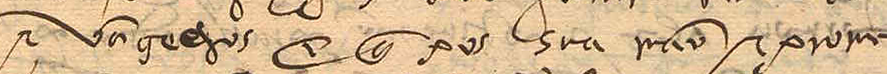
evāgelhos ē q̄ pos sua mão e prome
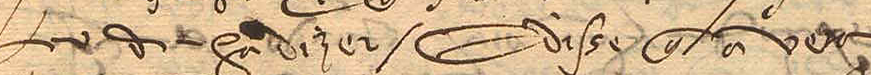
teo de ha dizer / E disse q̄ avera
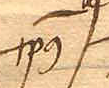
tp̄ꝯ /
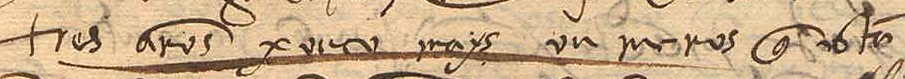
tres ānos pouco mays ou menos q̄ estā
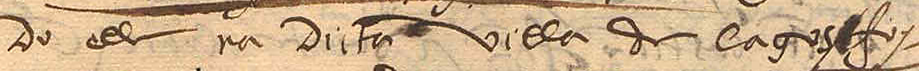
do elle na dicta villa de lagos _ foy
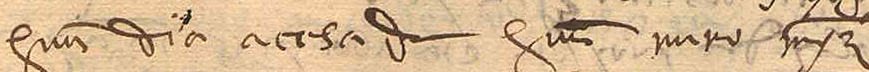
hūu dia a casa de hūu nuno m̄yz
